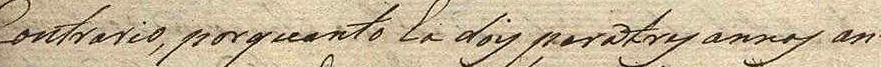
Contrario, porquanto ha dois para tres annos an
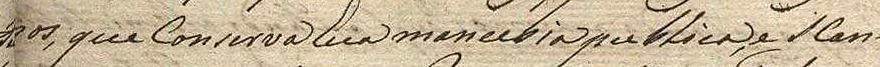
os, que Conserva hua mancebia publica, e sCan
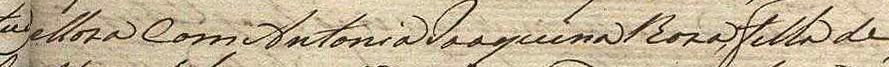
lloza Com Antonia Ioaquina Roza, filha de
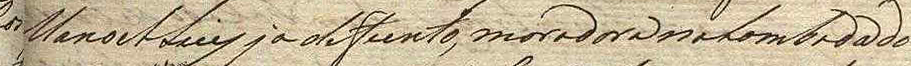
Manoel Luis ja defunto, moradora na lombada do
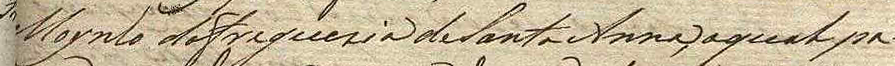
Moynho da freguezia de Santa Anna, a qual pa
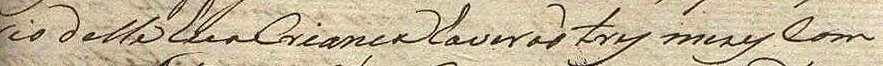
io delle hua Criança haveraõ tres mezes Com
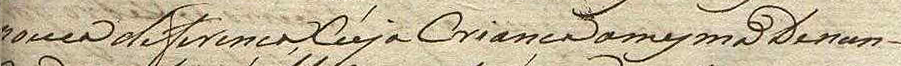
ouca deferença, Cuja Criança a mesma Denun
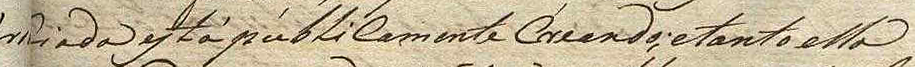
iada está publiCamente Creando; e tanto ella
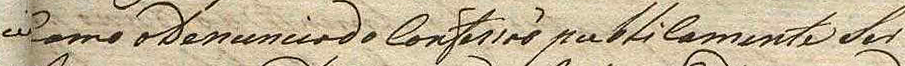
omo o Denunciado Confessaõ publiCamente Ser
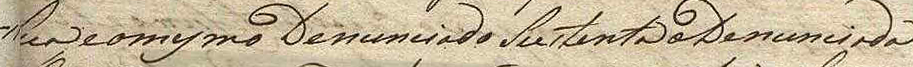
ua, e o mesmo Denunciado Sustenta a Denunciada
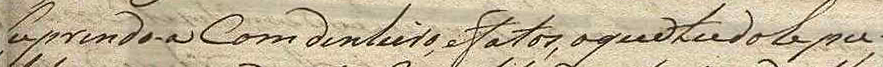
uprendo-a Com denheiro, e fatos, o que tudo he pu
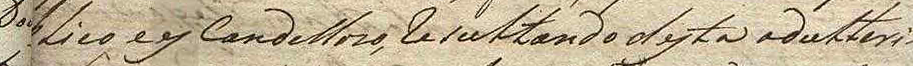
lico e esCandellozo, Resultando desta adulteri
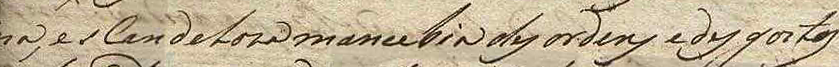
na, e sCandeloza mancebia desordens e desgostos
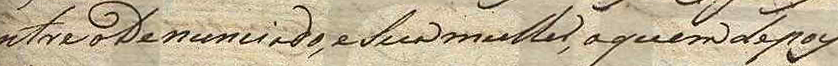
ntre o Denunciado, e Sua mulher, a quem depois
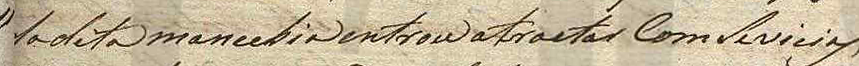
da dita mancebia entrou a tractar Com Sevicias,
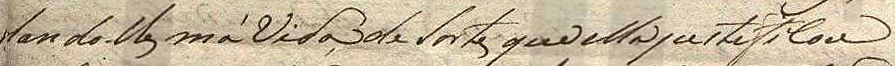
dando-lhe má Vida, de Sorte que ella justefiCou
